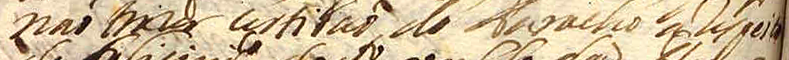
naõ trazer certidaõ do Paracho a Respeito
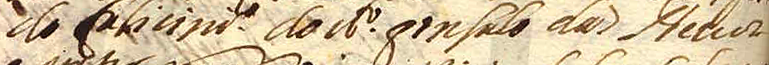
do falicim.to do d.o gonsalo das Neuez
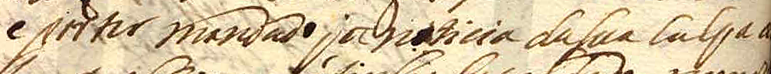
e por ter mandado ja noticia da sua Culpa a
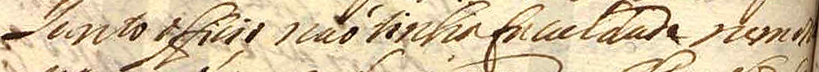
Santo officio naõ tinha faculdade nem
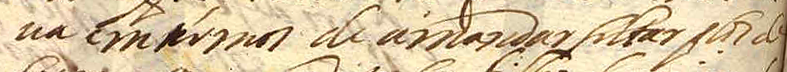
ua em termos de a mandar soltar plos do
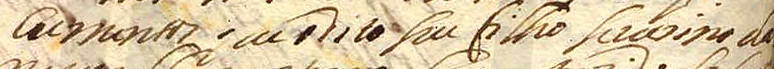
cumentos que o dito seu filho Seuerino da
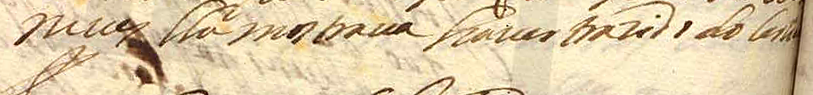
neues lha mostraua hauer trazido do Cert
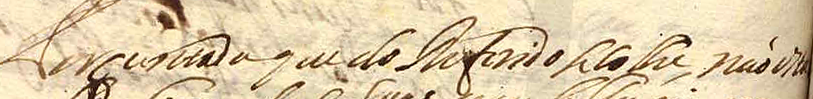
Perguntada que do Referido se colhe, naõ esta
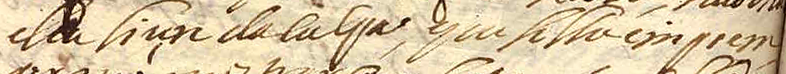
elle liure da culpa, que se lhe imprem
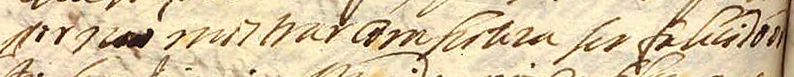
por naõ mostrar com serteza ser falecido di
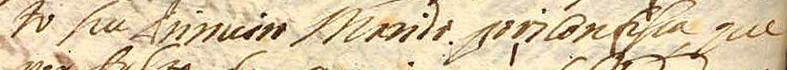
to seu Primeiro Marido pois Confessa, que
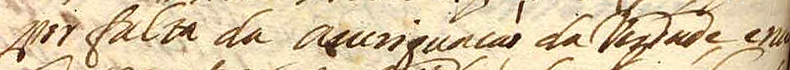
por falta da aueriguaçaõ da Verdade e não
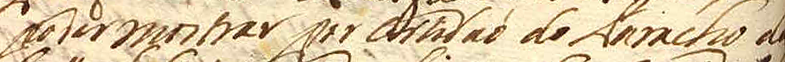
poder mostrar por certidaõ do Paracho da
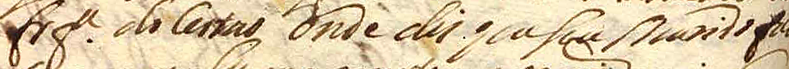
frg.a do Certao onde dis que seu Marido fale
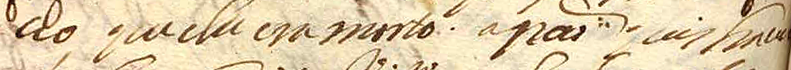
ceo que elle era morto: a naõ quis hauer
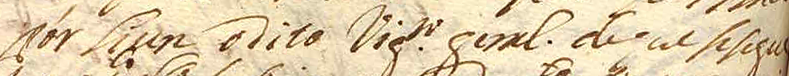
por liure o dito Vig.ro geral. de que se segue
